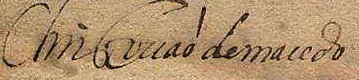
Christouaõ de macedo
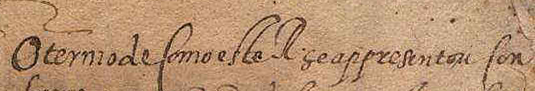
O termo de Como este R. se appresentou Con
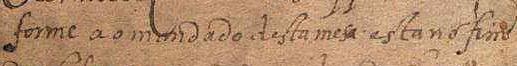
forme ao mandado desta mesa esta no fim
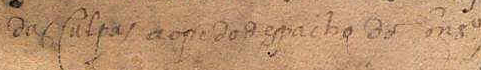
das Culpas ao pe do despacho do Conso
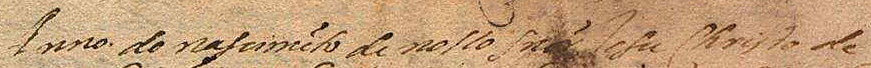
Anno do nascimēto de nosso snor̄ Jesu Christo de
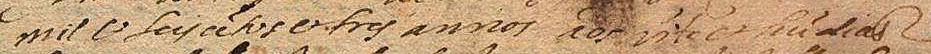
mil e seiscētos e tres annos aos vīte e hū dias
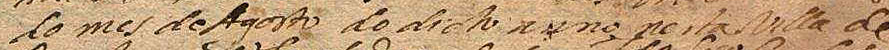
do mes de Agosto do dicto anno nesta villa de
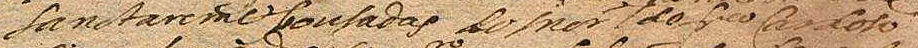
sanctarem e pousadas do snor̄ ldo frco Cardoso
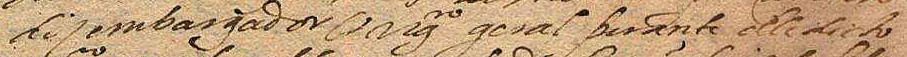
dezembargador e vigro geral perante elle dicto
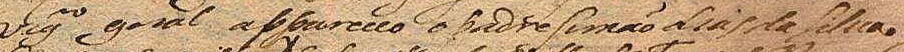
Vigro geral appareceo o padre simaõ dias da silua
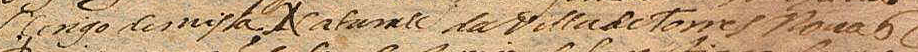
Clerigo de missa Natural da villa de Torres nouas
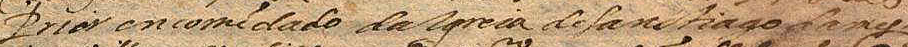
Prior encomēdado da Igreia de sanctiago da mes
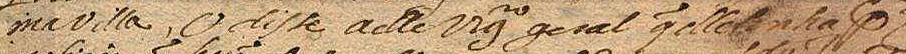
ma villa, e disse a elle Vigro geral q̄ elle tinha p̄
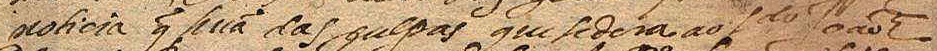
noticia q̄ huā das culpas que se dera ao Ldo Joaõ
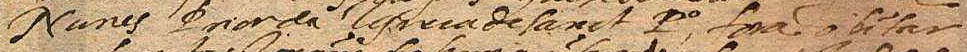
Nunes Prior da Igreia de sanct Po, fora o bētar
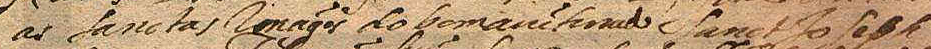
as sanctas Imagēs do bem auēturado Sanct Joseph
